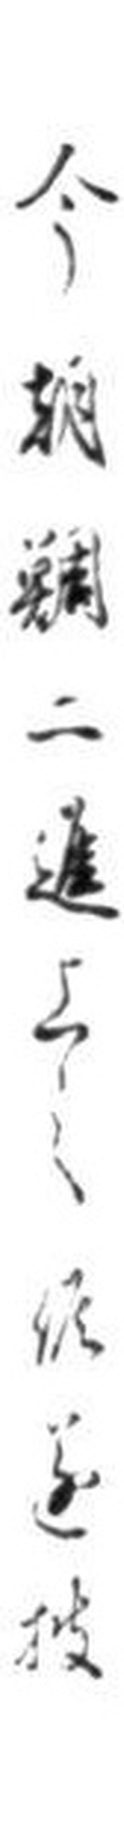今朝鯛二進上之候遂披
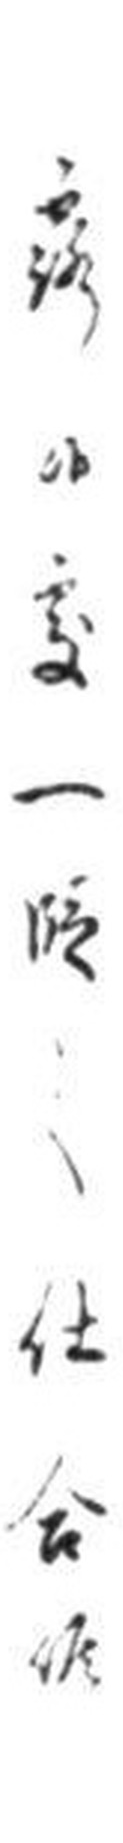露候処一段之仕合候
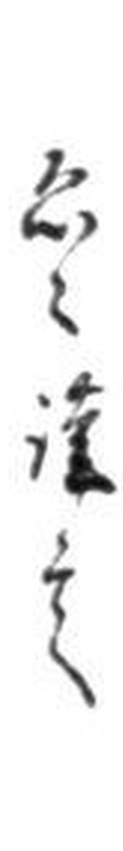恐々謹言
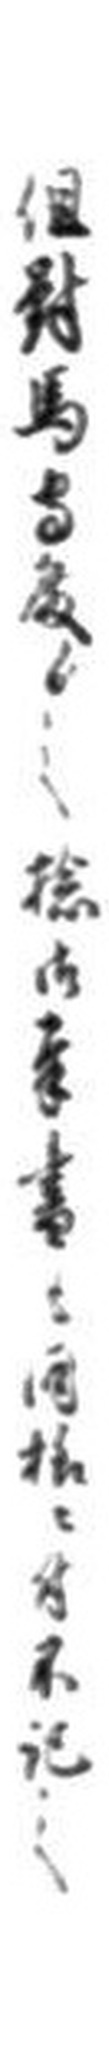但対馬守殿ゟ之捻御奉書は同様ニ付不記之
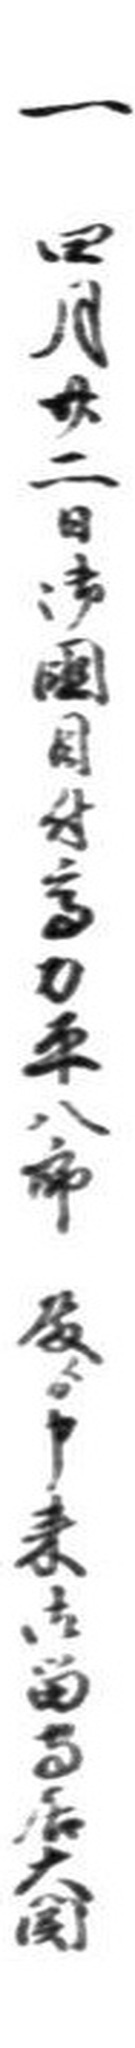一四月廿二日御国目付高力平八郎殿ゟ申来御留守居大関
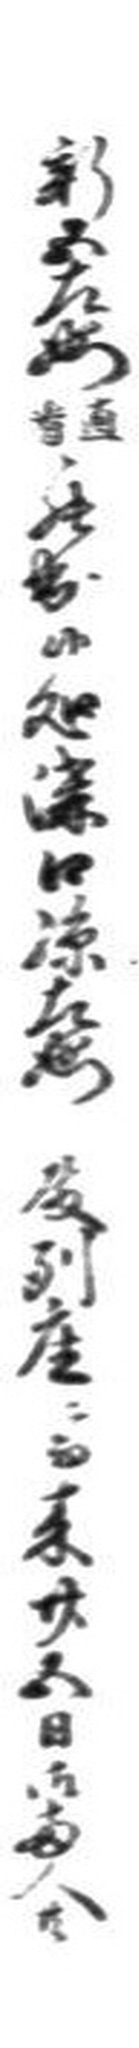新五左衛門直宥罷出候処溝口孫左衛門殿列座ニ而来廿五日御両人共
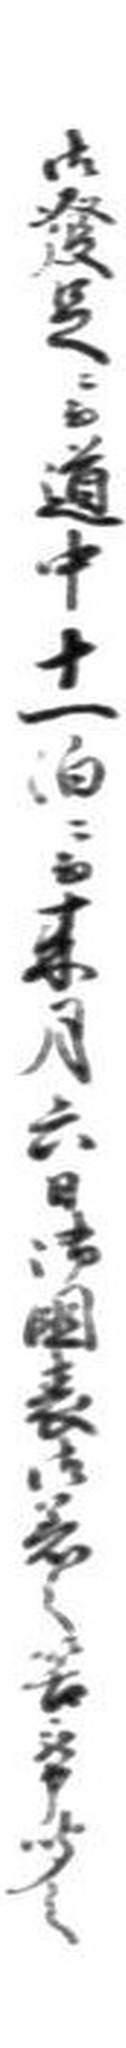御発足ニ而道中十一泊ニ而来月六日御国表御着之筈被申聞之
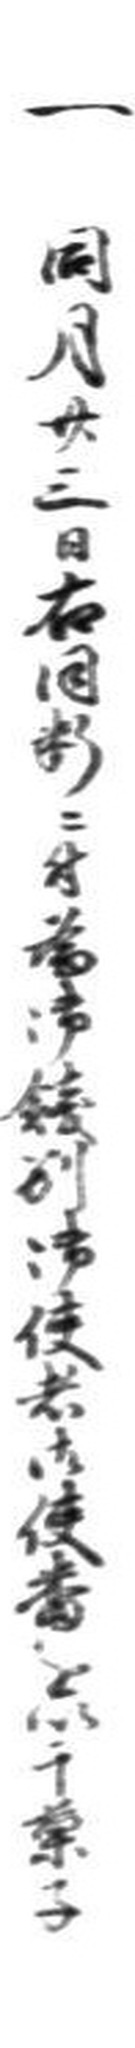一同月廿三日右同断ニ付為御餞別御使者御使番を以干菓子
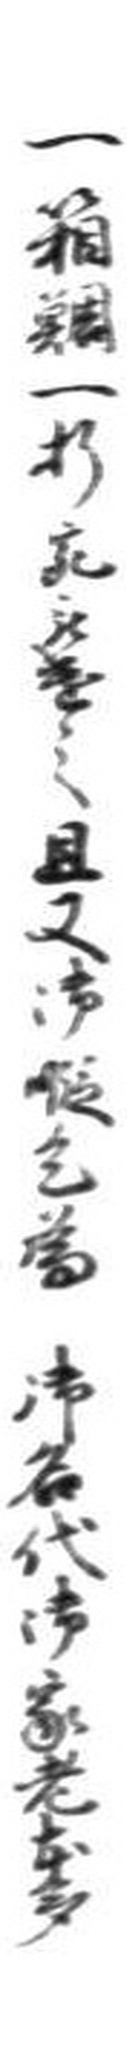一箱鯛一折宛被遣之且又御暇乞為御名代御家老本多
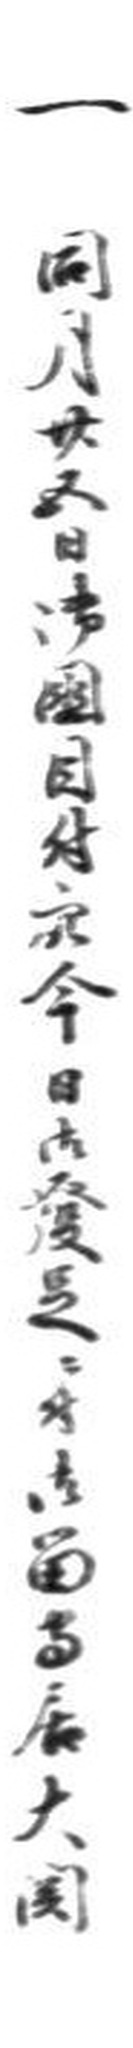一同月廿五日御国目付衆今日御発足ニ付御留守居大関

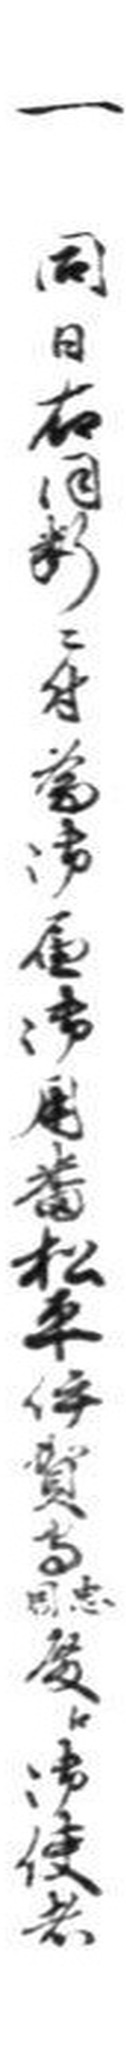一同日右同断ニ付為御届御用番松平伊賀守忠周殿江御使者
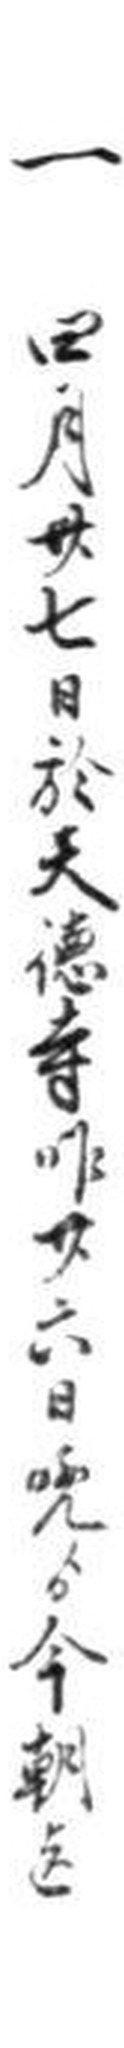一四月廿七日於天徳寺昨廿六日晩ゟ今朝迄
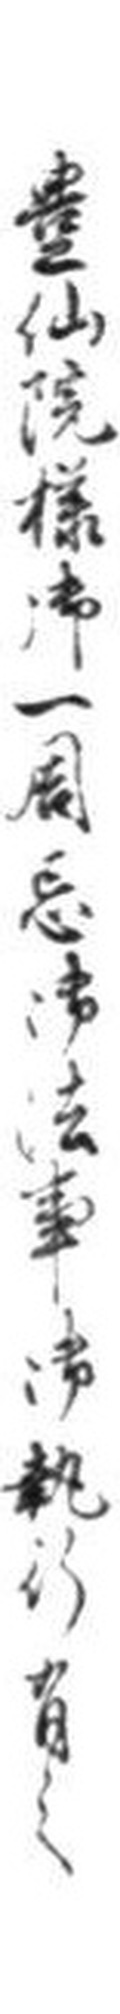豊仙院様御一周忌御法事御執行有之
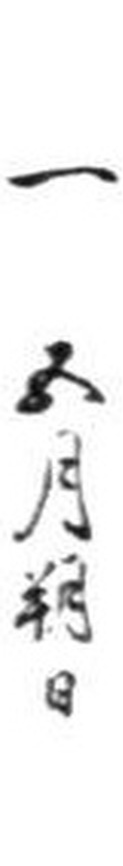一五月朔日
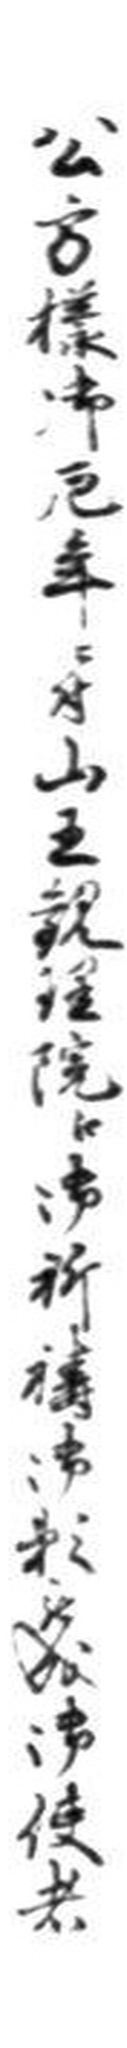公方様御厄年ニ付山王観理院江御祈禱御頼被成御使者
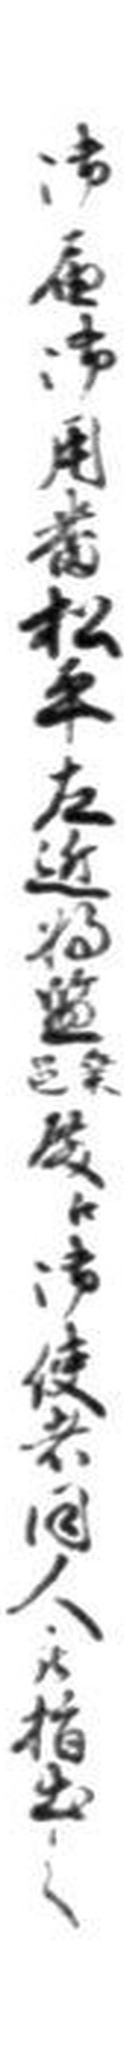御届御用番松平左近将監乗邑殿江御使者同人被指出之
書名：家譜 三十九 宗矩公 享保十年
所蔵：福井県文書館 Fukui Prefectural Archives
